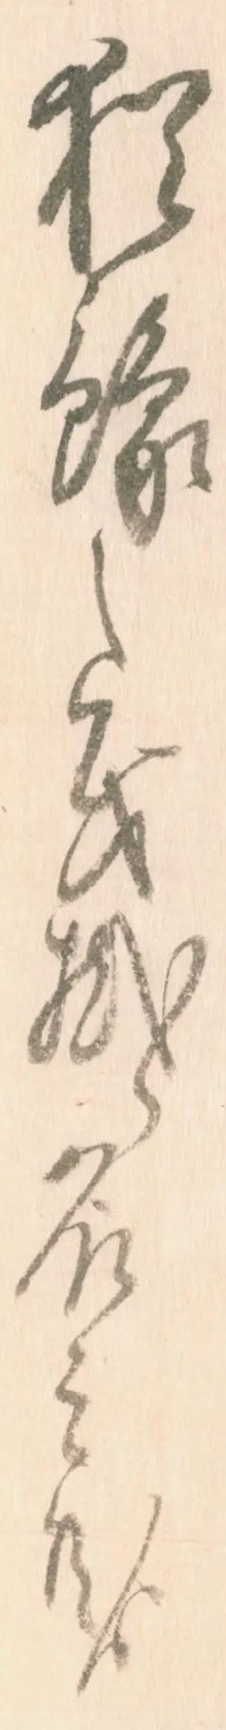猶予之義掛リ名主共ゟ
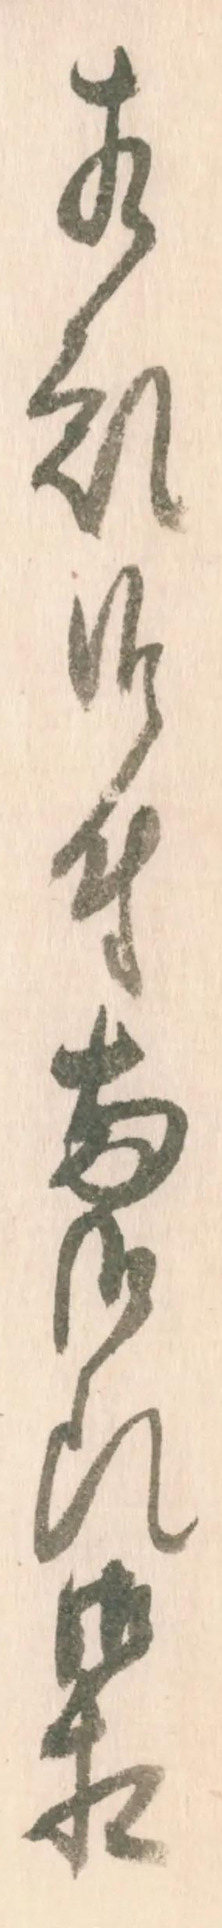相願候ニ付両御頭御相
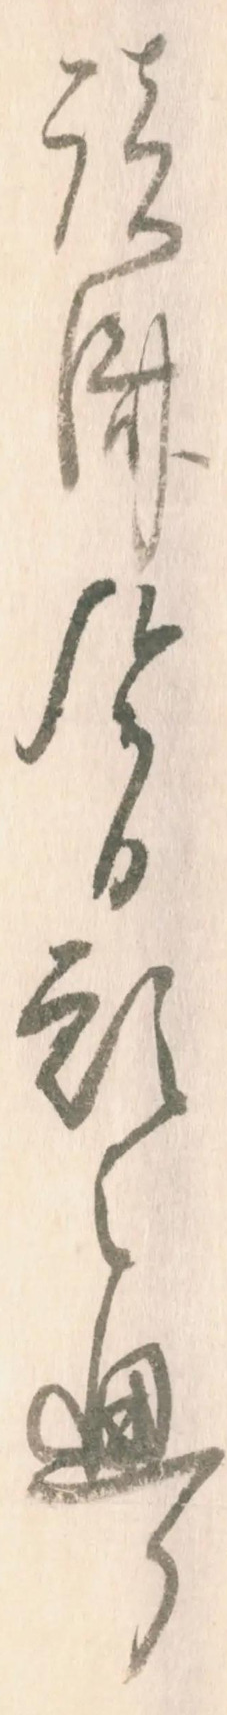談済日願之通リ
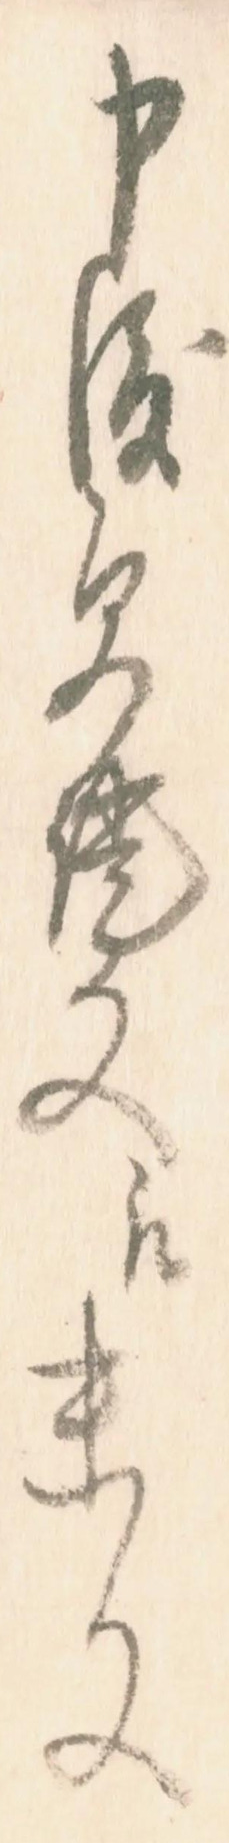申渡受証文え末文
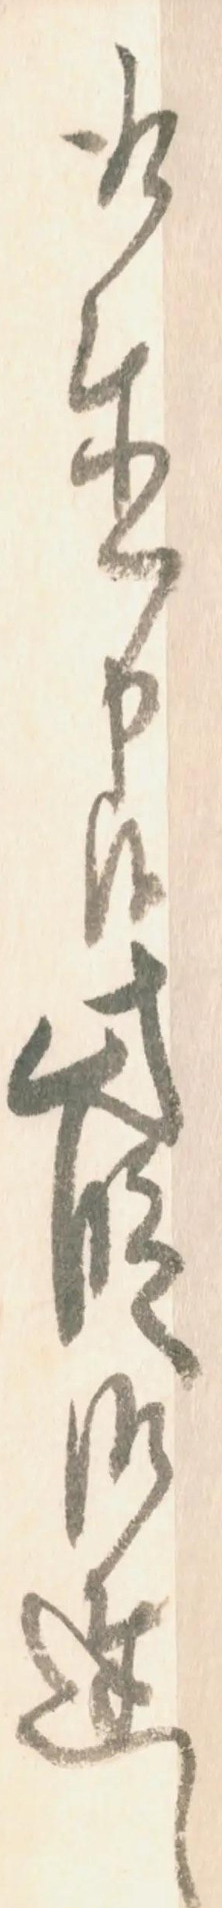取置申候此段御達し
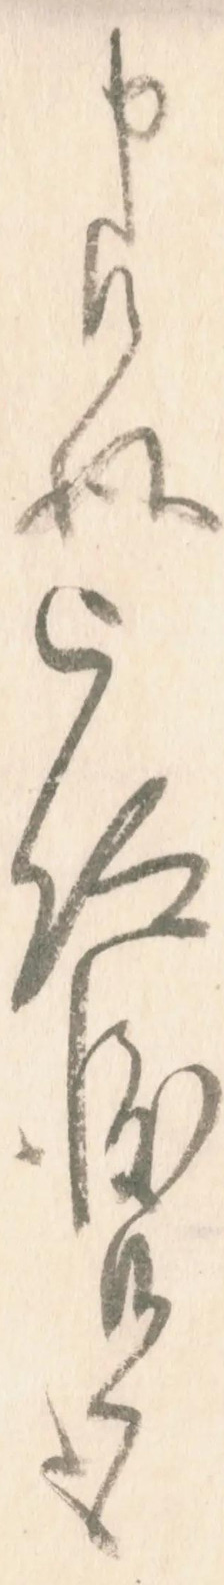申候様被仰渡候以上
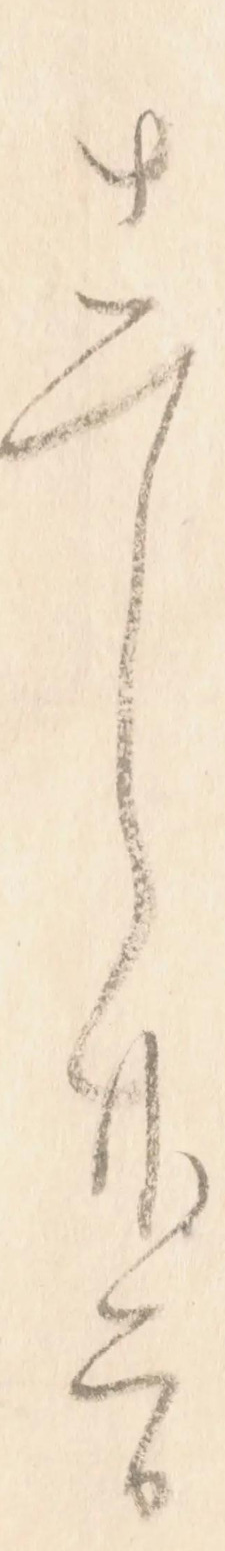十二月廿二日

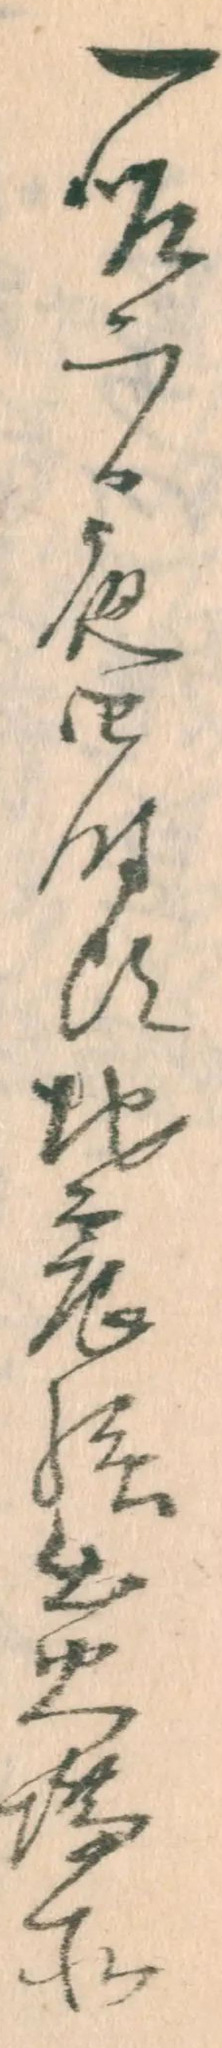一昨二日夜四時頃地震強出火場所
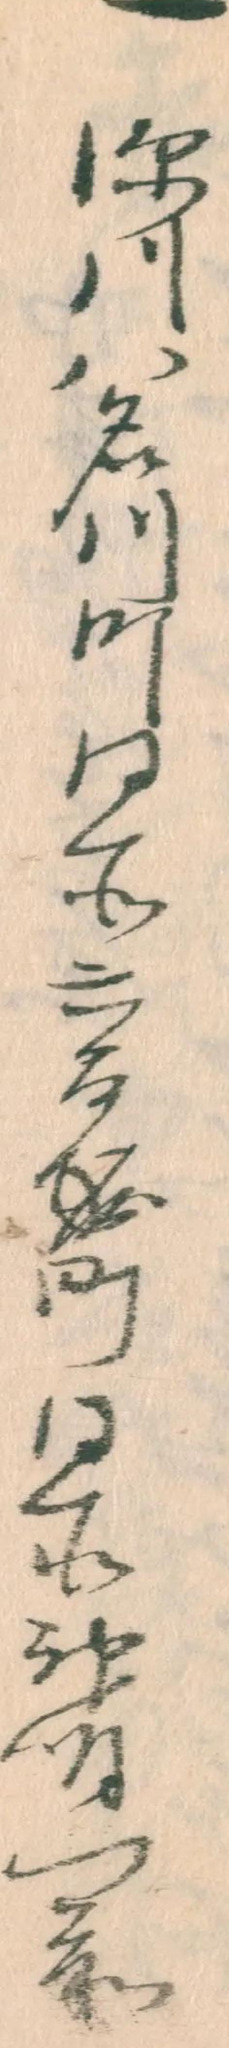一深川八名川町同所六間堀町同所神明門前
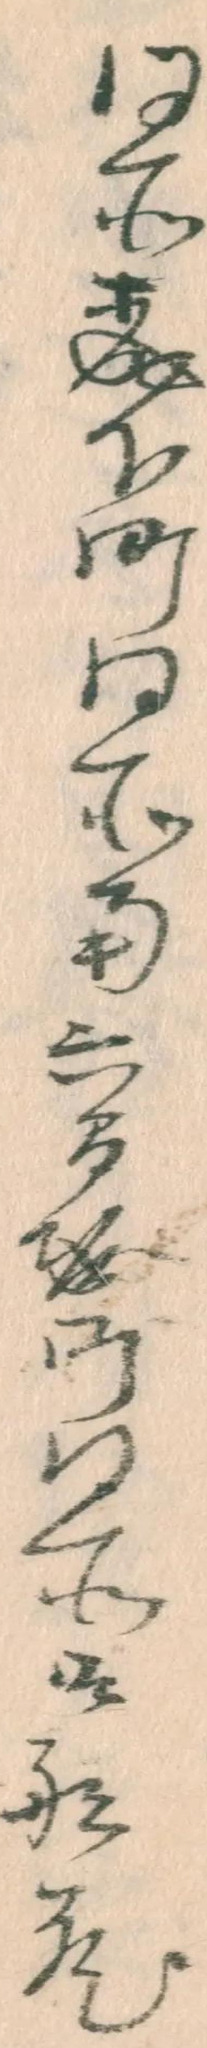同所森下町同所南六間堀町同所御船蔵
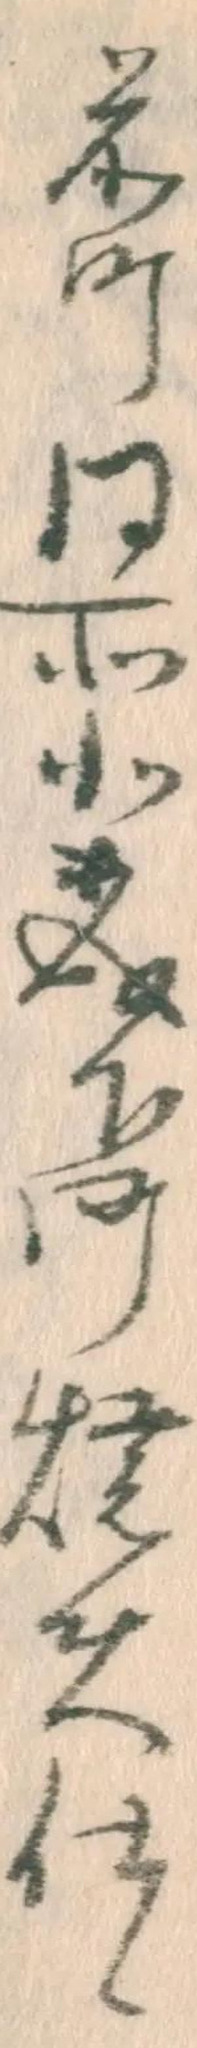前町同所北森下町焼失仕候
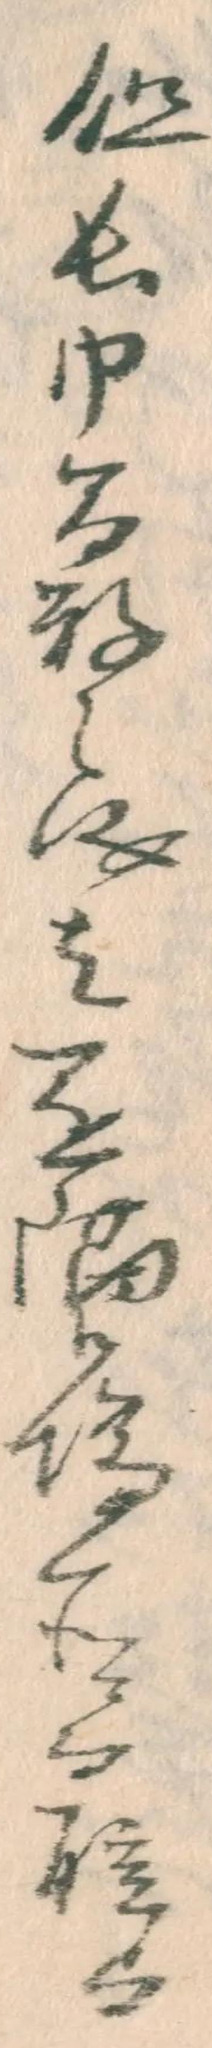但長幅間数之儀は懸隔候場所ニ而聢と
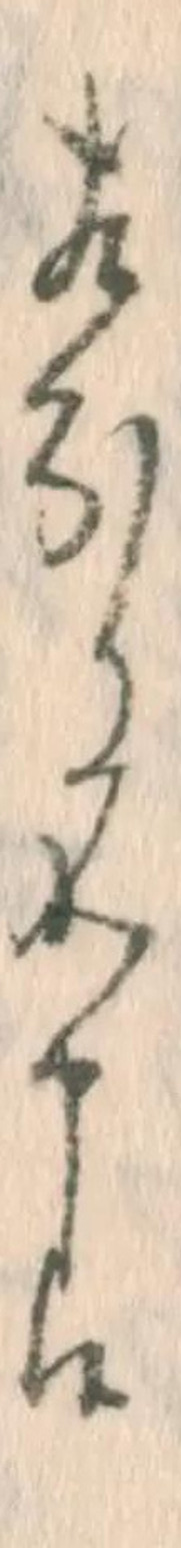相分リ不申候
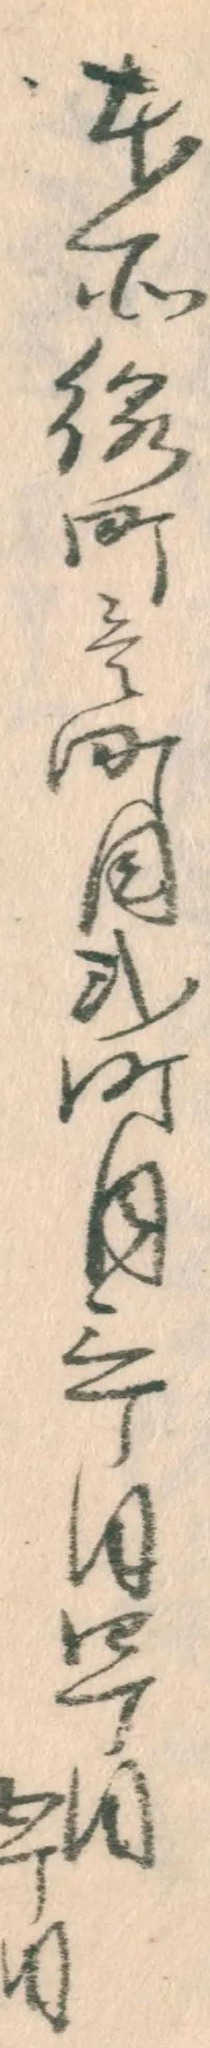一本所緑町壱町目弐町目三丁目四丁目五丁目
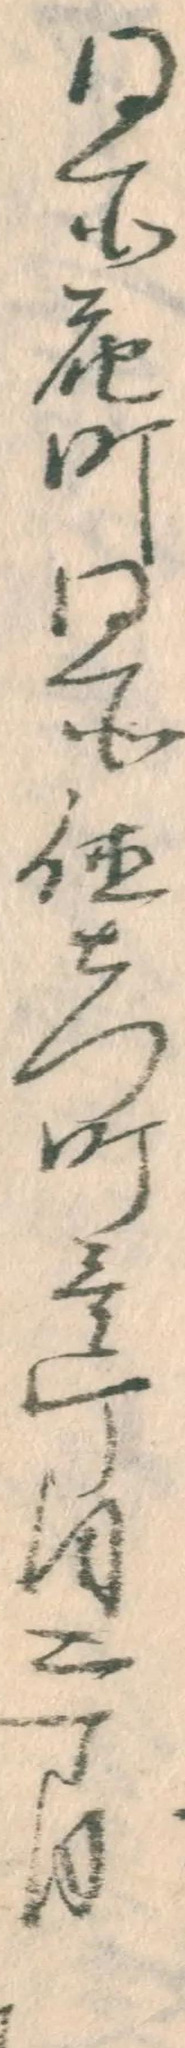同所花町同所徳右衛門町壱丁目二丁目菊川町
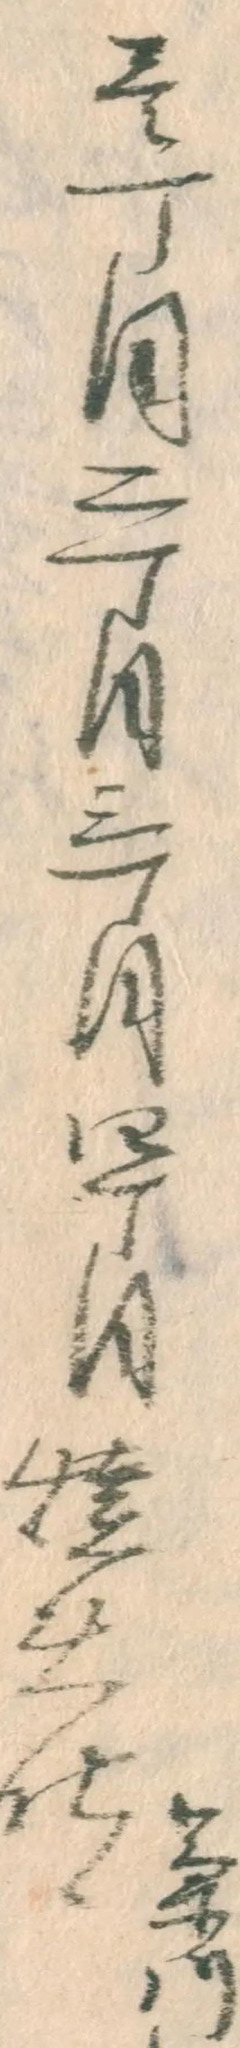壱丁目二丁目三丁目四丁目焼失仕候
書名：地震災書留 2巻. [1] 内表紙に「地震災書留　安政二卯年　但本所深川御用屋敷地代免除調」とあり
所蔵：国立国会図書館 National Diet Library, JAPAN
